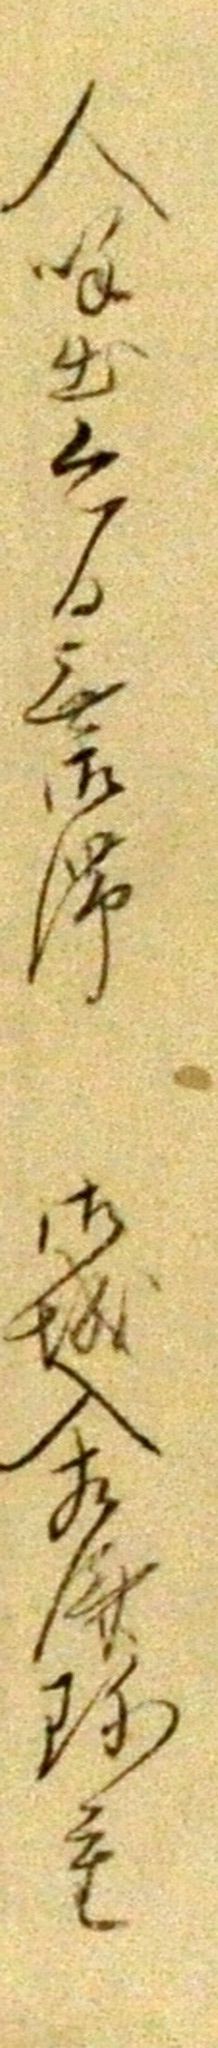人呼出今日無御滞御城入相済珍重
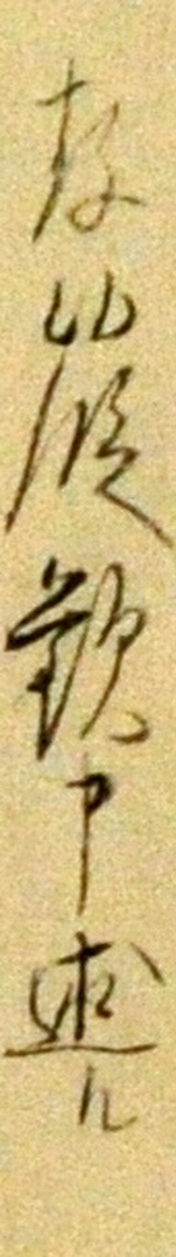存候段歎申述ル
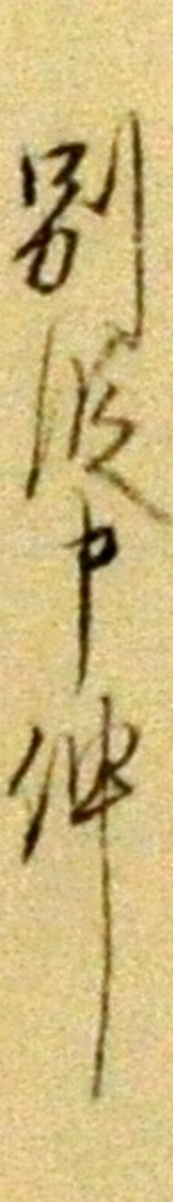別段申伸
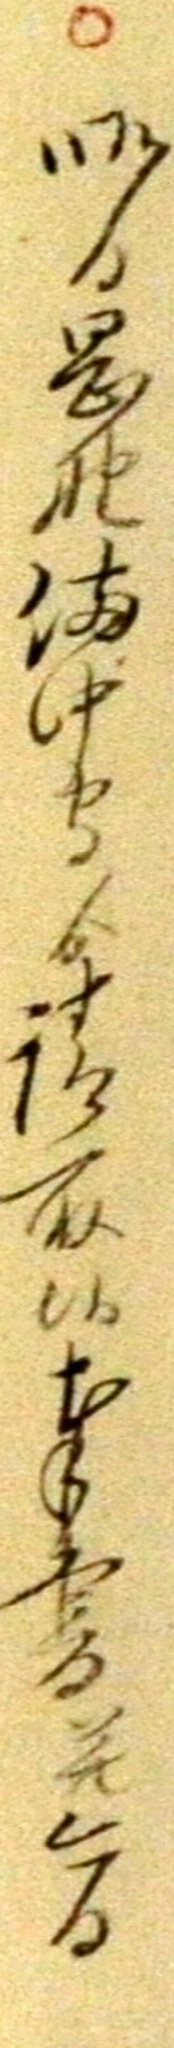昨日岡野備中守ゟ請取候奉書并今日

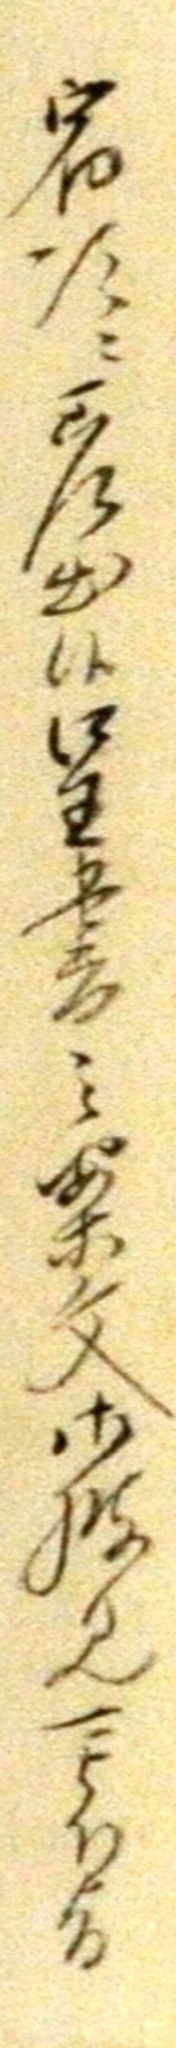宿次ニ差出候呈書之案文御披見可被下旨
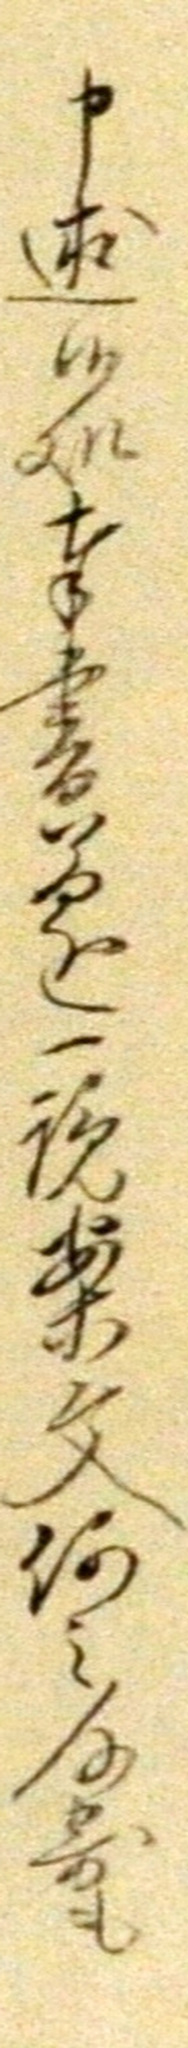申述候処奉書遂一覧案文何之存寄も
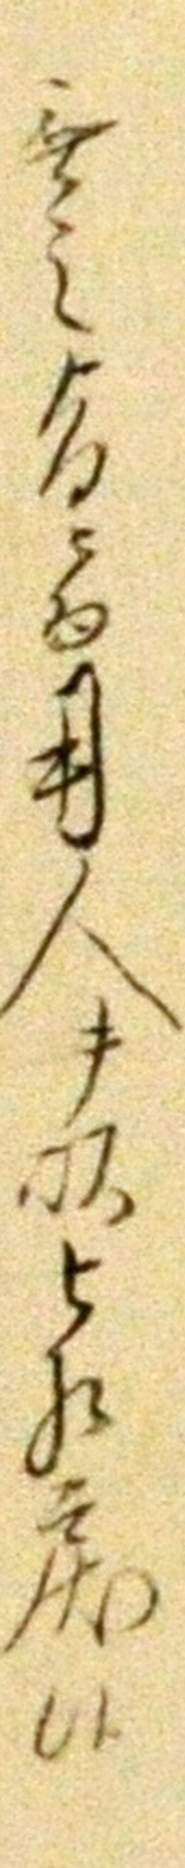無之旨ニ而用人ヲ以被相戻候
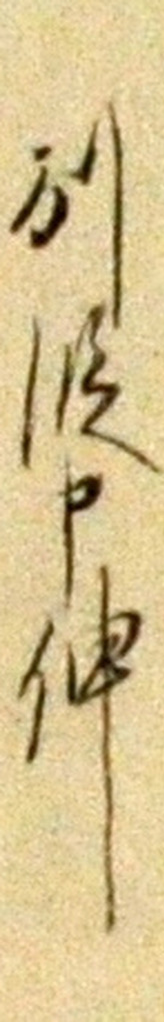別段申伸
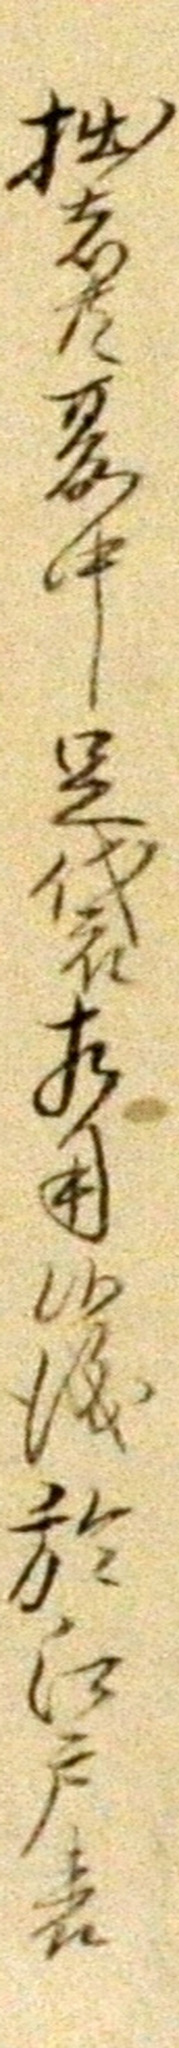拙者共夏中足袋相用候儀於江戸表
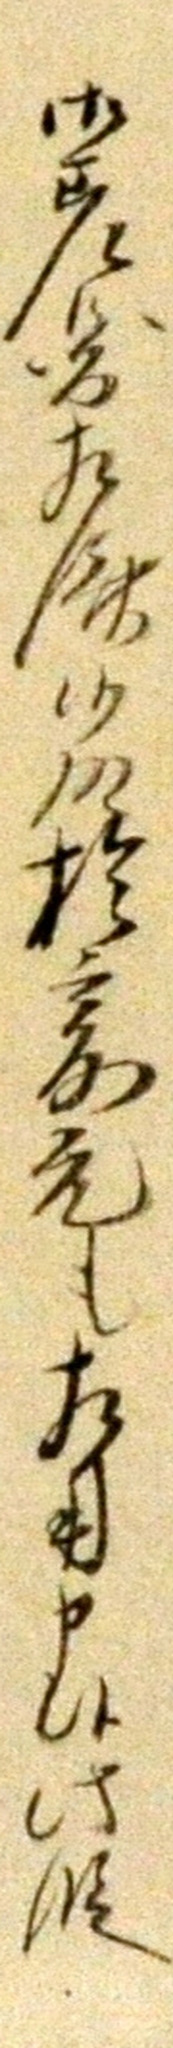御差図相済候故於爰元も相用申候此段
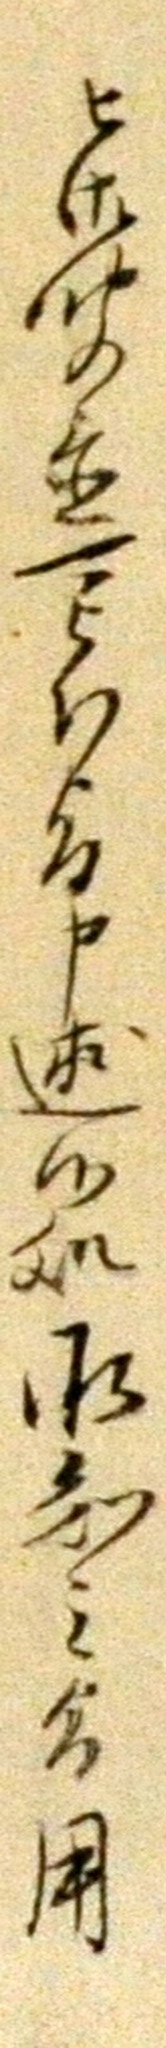被御聞置可被下旨申述候処承知之旨用
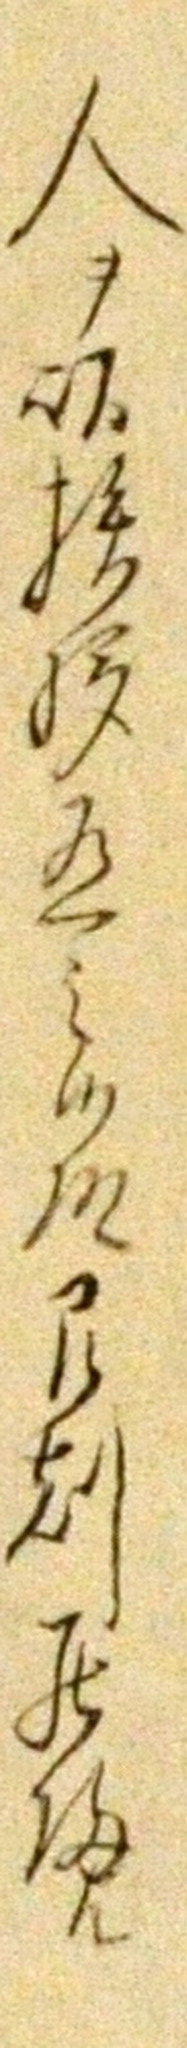人ヲ以挨拶有之候故即刻罷帰ル
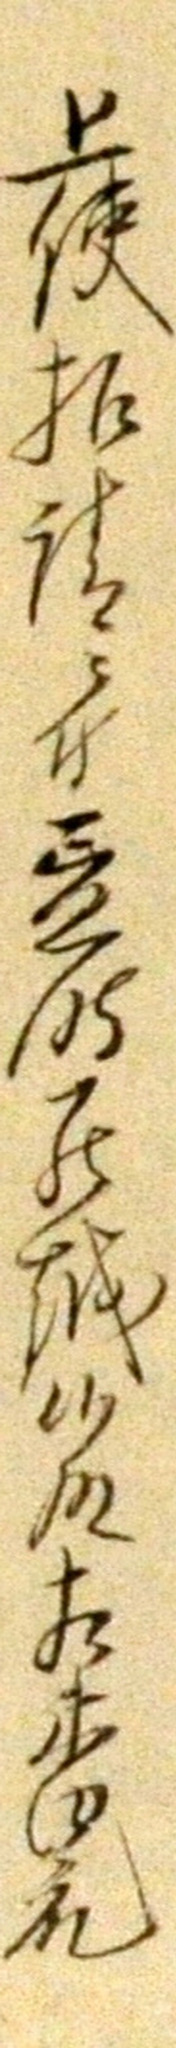上使招請ニ付昼時罷越候故相番衆
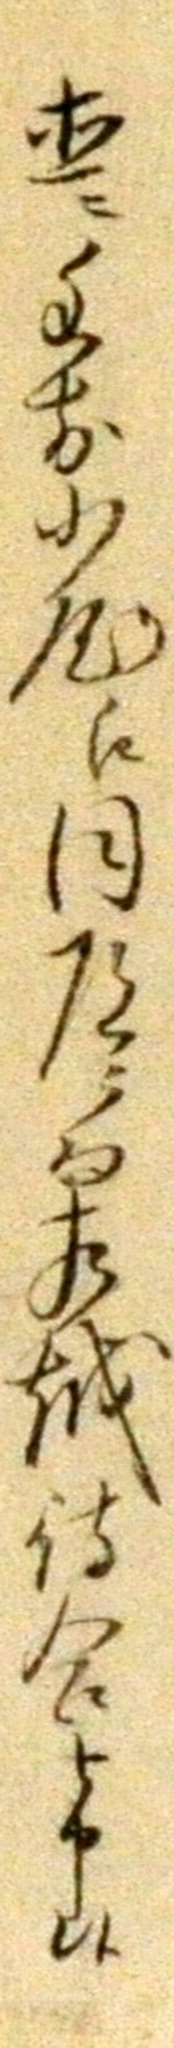直ニ手前小屋エ同道ニ而相越待合被申候
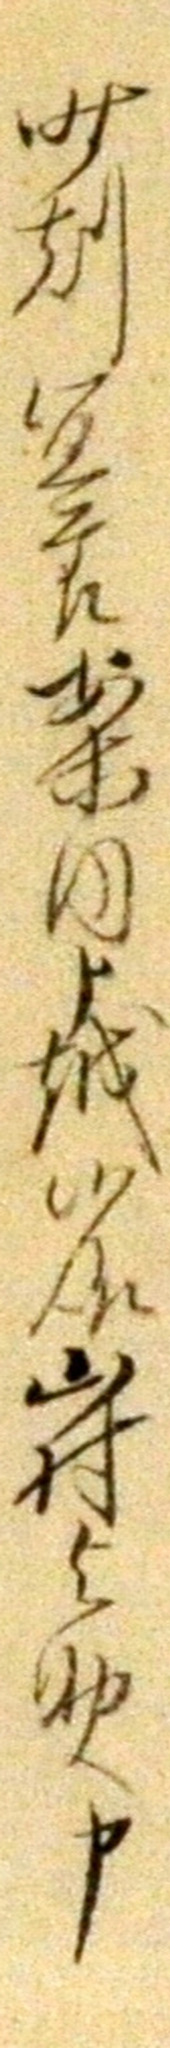時刻宜節案内申越候様山村与助へ申
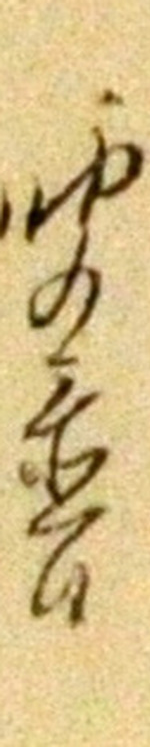聞置候
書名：大阪加番関係諸書留〔一括〕
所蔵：伊那市立高遠町図書館・合同会社AMANE
